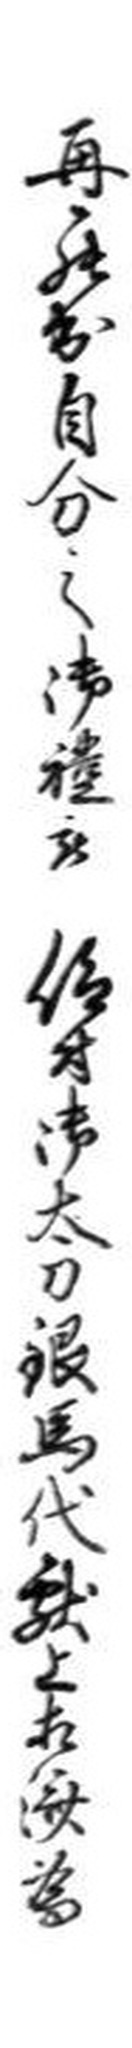再罷出自分之御礼被仰付御太刀銀馬代献上相済為
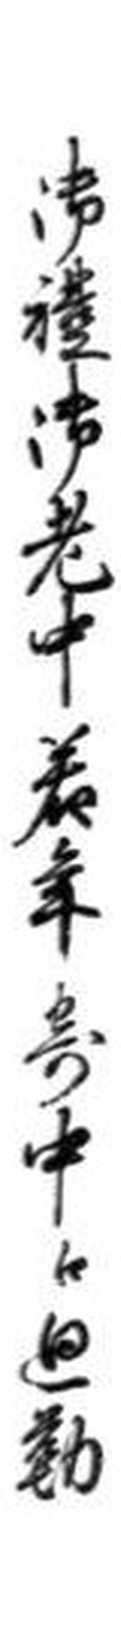御礼御老中若年寄中江廻勤
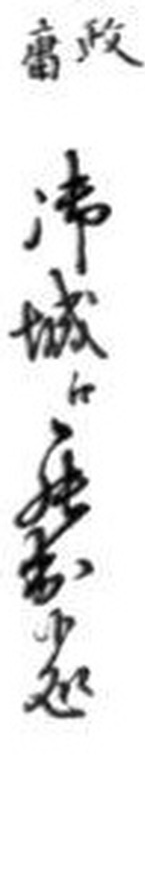庸御城江罷出候処
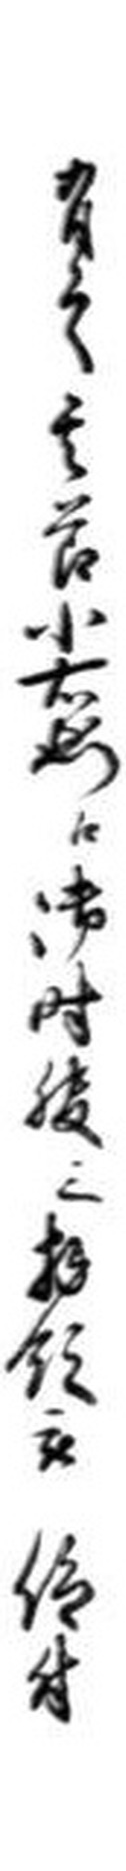有之其節小右衛門江御時服三拝領被仰付
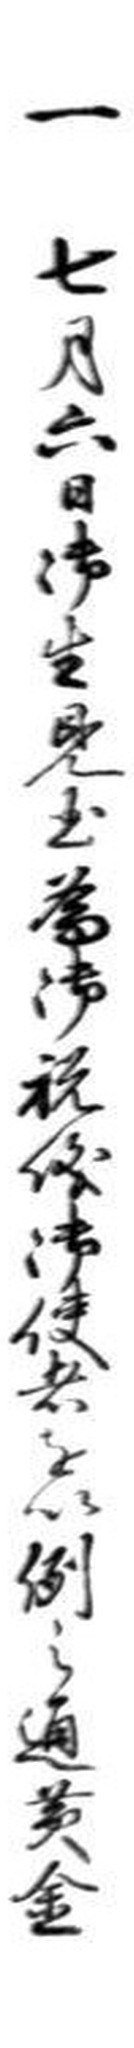一七月六日御生見玉御祝儀御使者を以例之通黄金
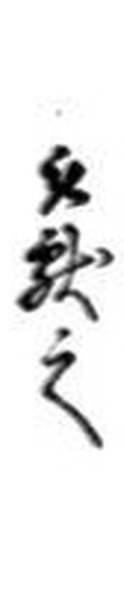被献之
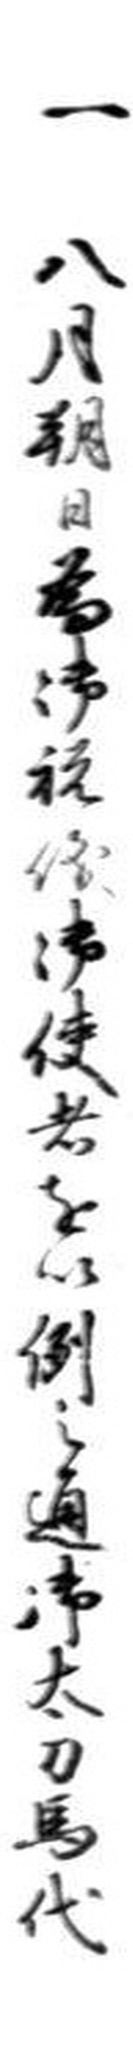一八月朔日為御祝儀御使者を以例之通御太刀馬代
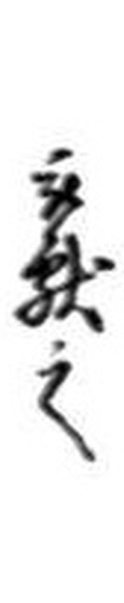被献之
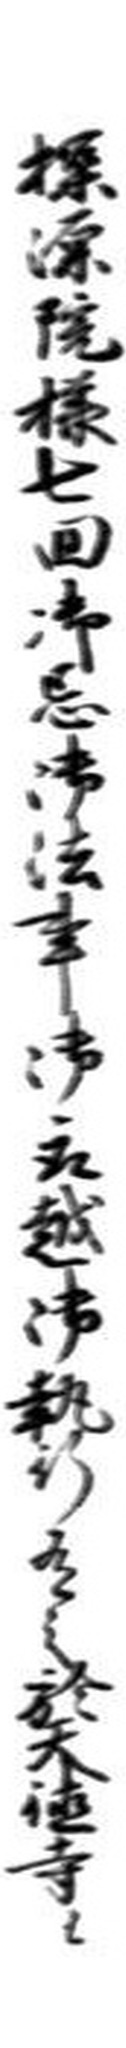探源院様七回御忌御法事御取越執行有之於天徳寺も
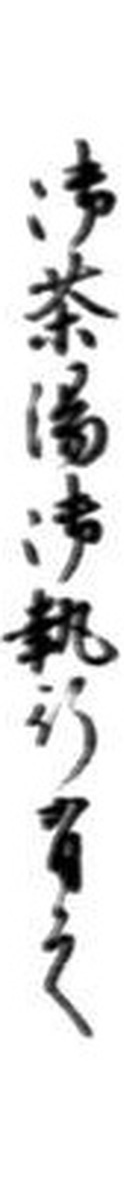御茶湯御執行有之
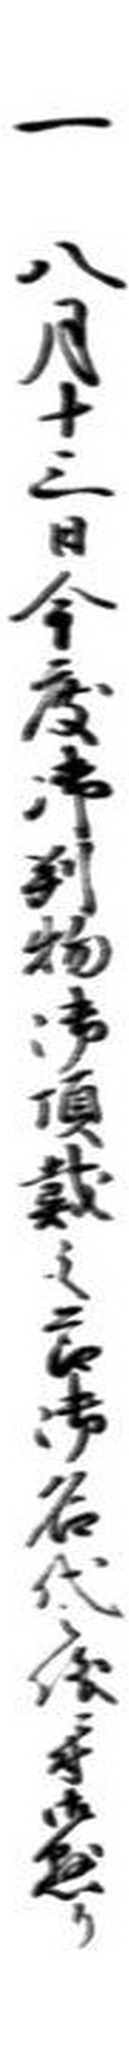一八月十三日今度御判物御頂戴之節名代之儀ニ付御懸り

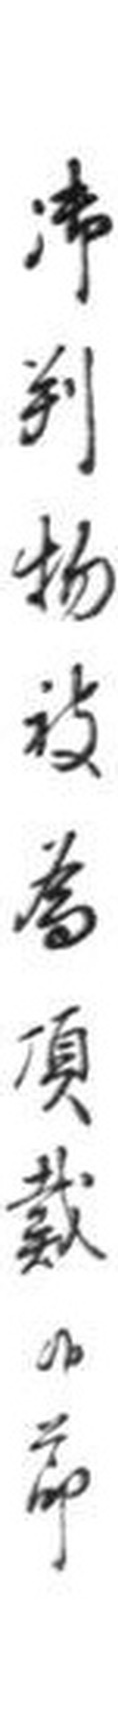御判物被為頂戴候節
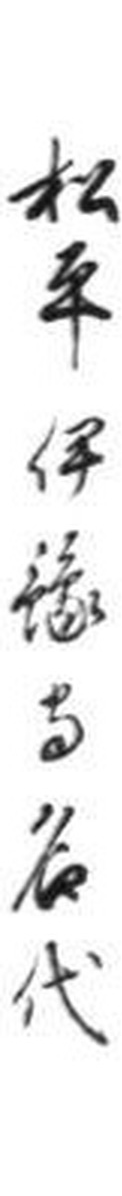松平伊予守名代
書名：家譜 三十二 吉邦公 従享保二年到享保三年
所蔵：福井県文書館 Fukui Prefectural Archives
